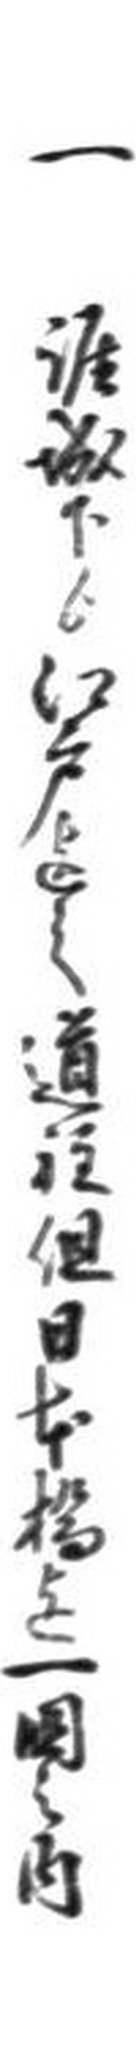一誰城下ゟ江戸迄之道程但日本橋迄一国之内
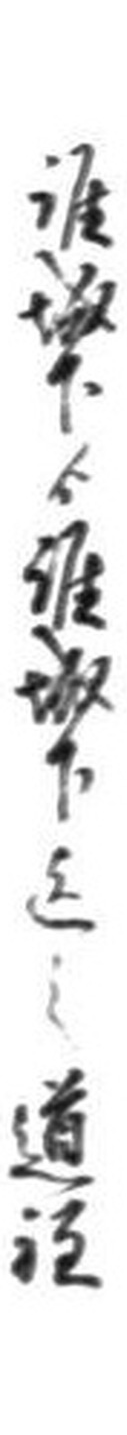誰城下ゟ誰城下迄之道程
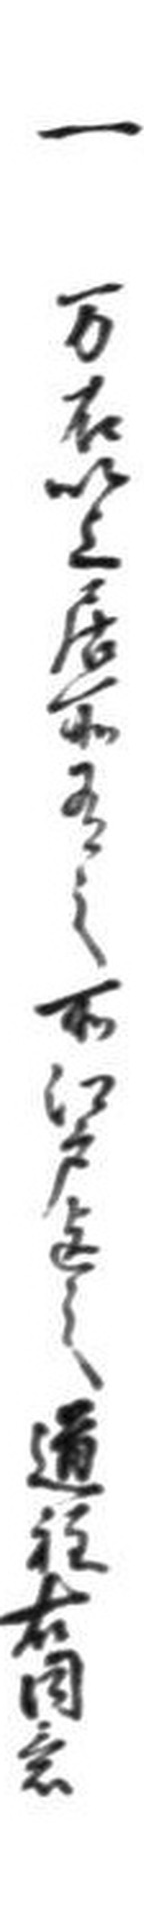一万石以上居所有之所江戸迄之道程右同意

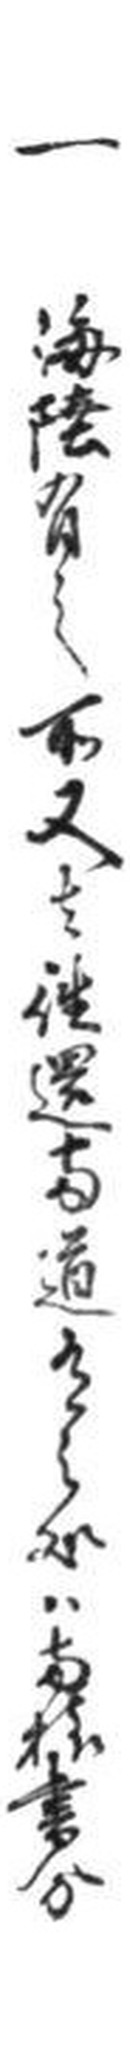一海陸有之所又者往還両道有之処ハ両様書分
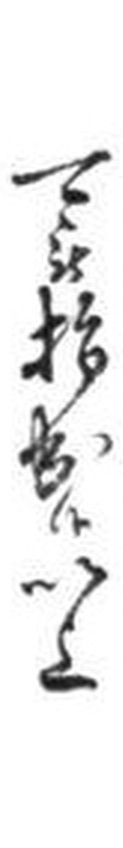可被指出候以上
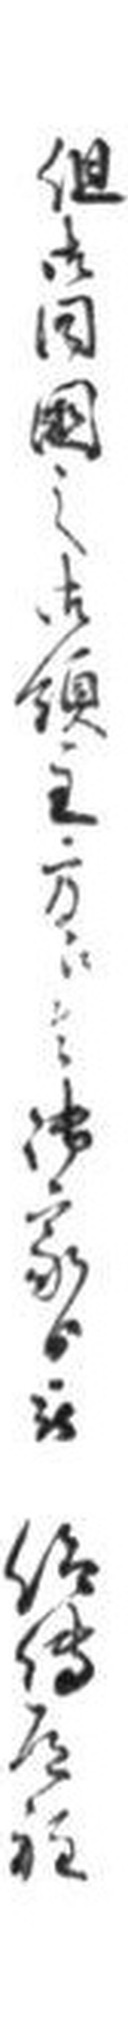但御同国之御領主方江者御家ゟ被仰伝道程
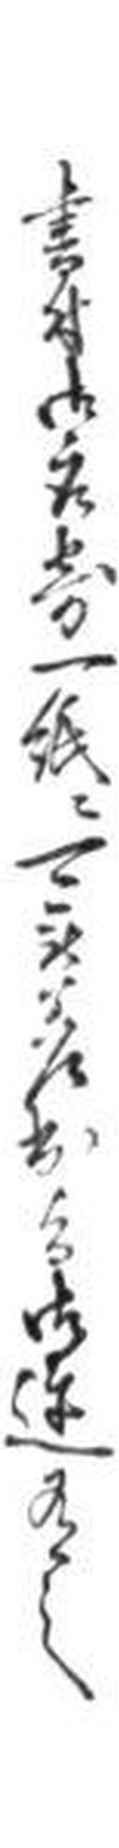書付御取寄一紙ニ可被差出旨御達有之
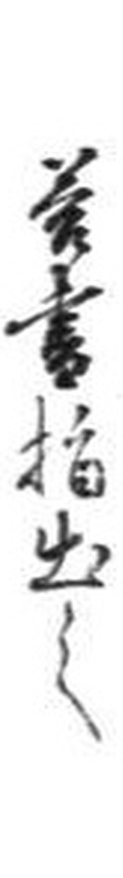答書指出之
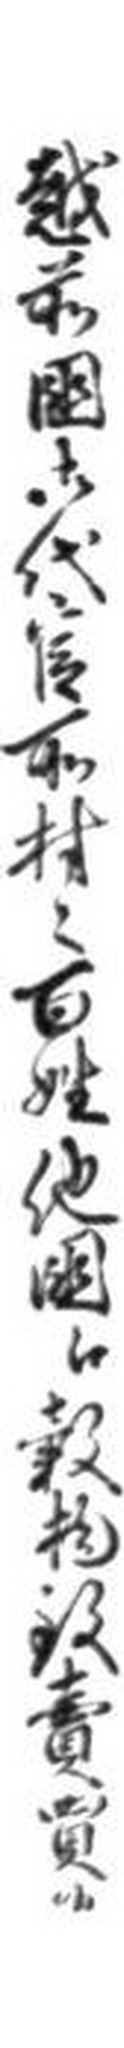越前国御代官所村々百姓他国江穀物致売買候
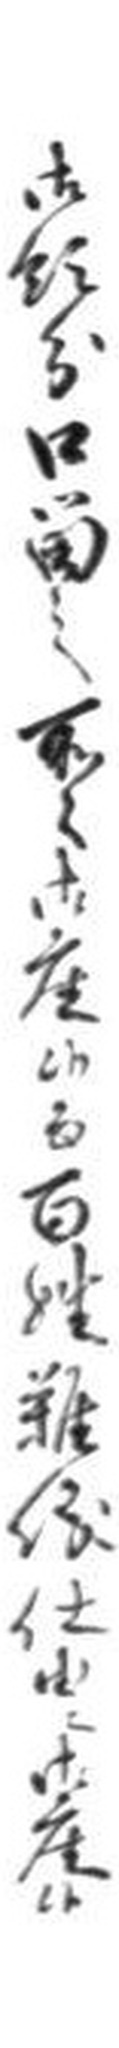御領分口留之所々御座候而百姓難儀仕由ニ御座候
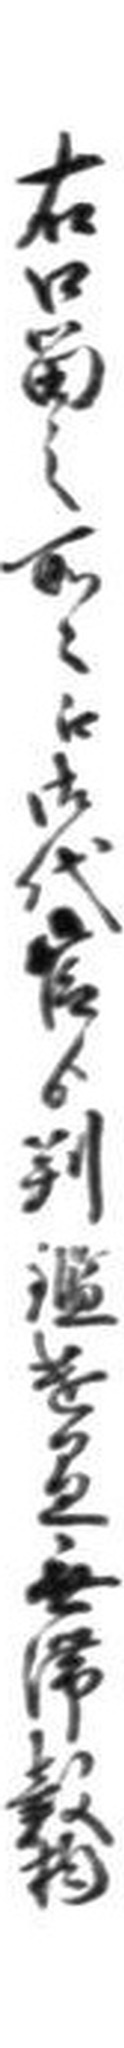右口留之所々江御代官ゟ判鑑遣置無滞穀物
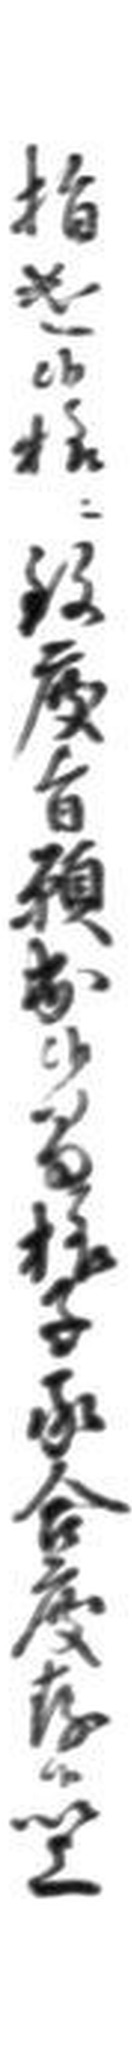指遣候様ニ致度旨願出候間様子承合度存候以上
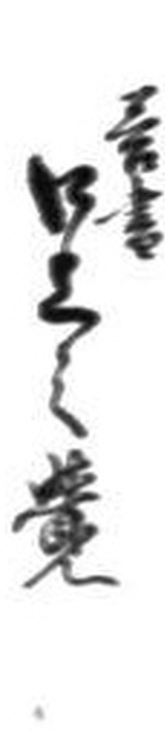口上之覚
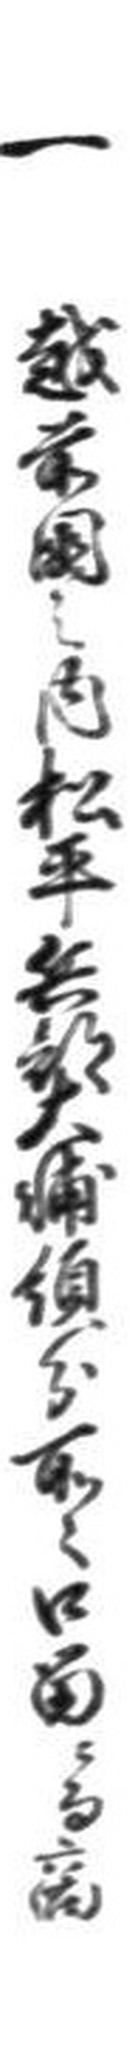一越前之内松平兵部大輔領分所々口留ニ而商
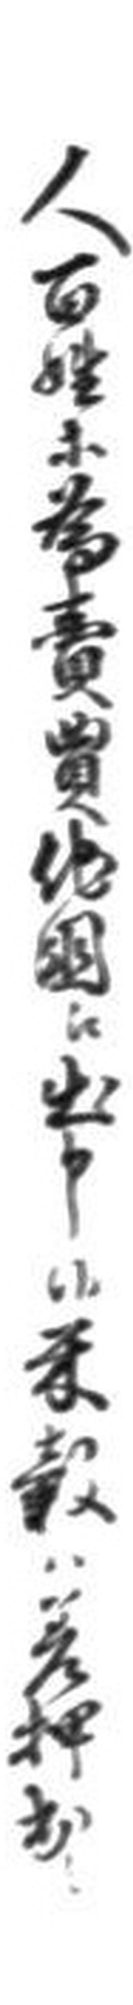人百姓等為売買他国江出申候米穀ハ差押出し
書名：家譜 二十二 吉品公 従元禄十五年到同十六年
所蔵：福井県文書館 Fukui Prefectural Archives
